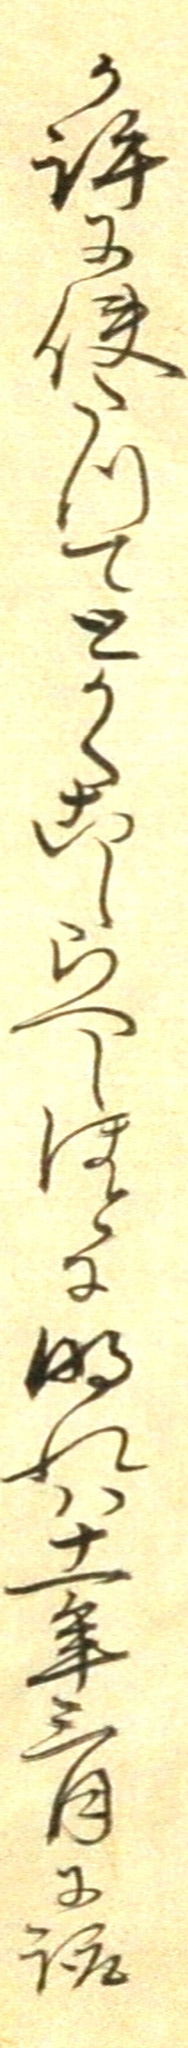か許に使たつてとかくこしらへしほとに明れは十一年三月に諏
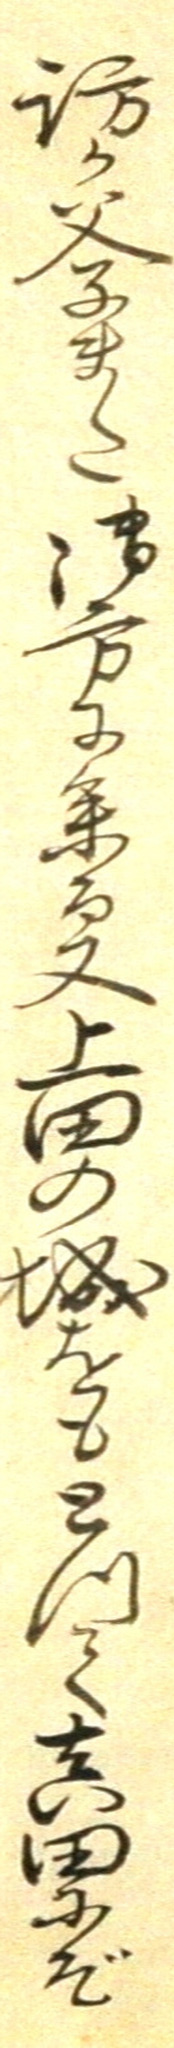訪か父子また御方に参る又上田の城をもとつて真田にぞ
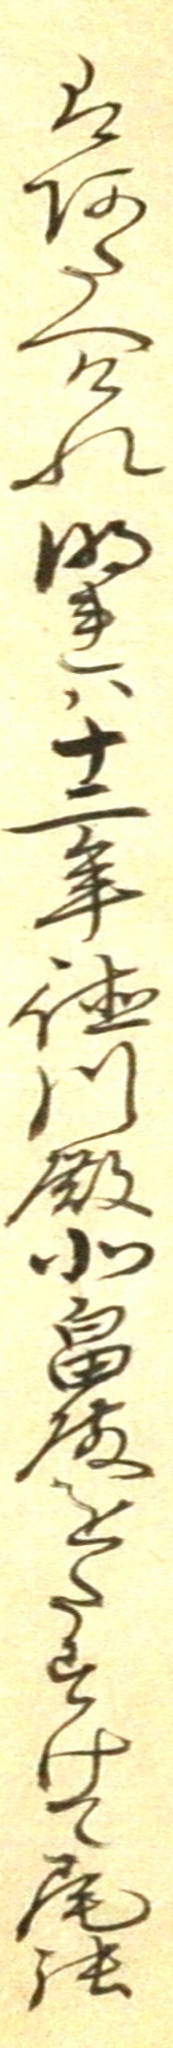はあたへけれ明れは十二年徳川殿北畠殿をたすけて尾張
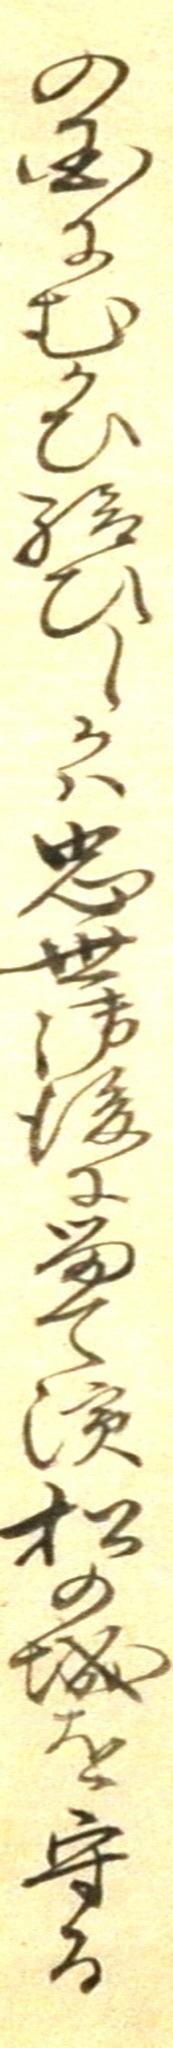の国にむかひ給ひしかは忠世御後に留て浜松の城を守る
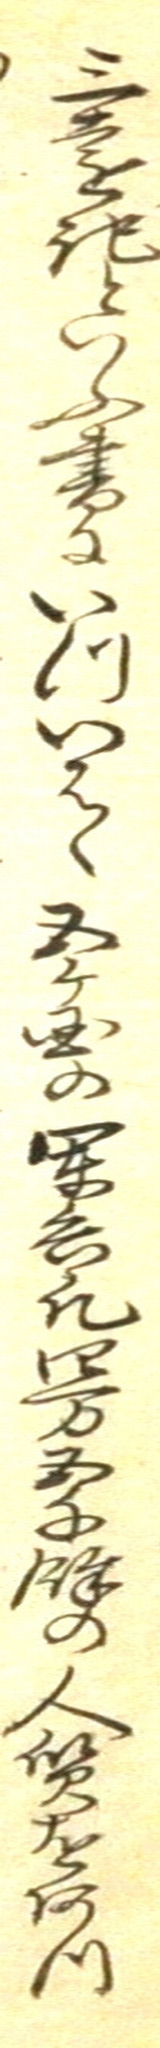三遠記といふ書にいついはく五ヶ国の軍兵凡四万五千余の人質をあつ
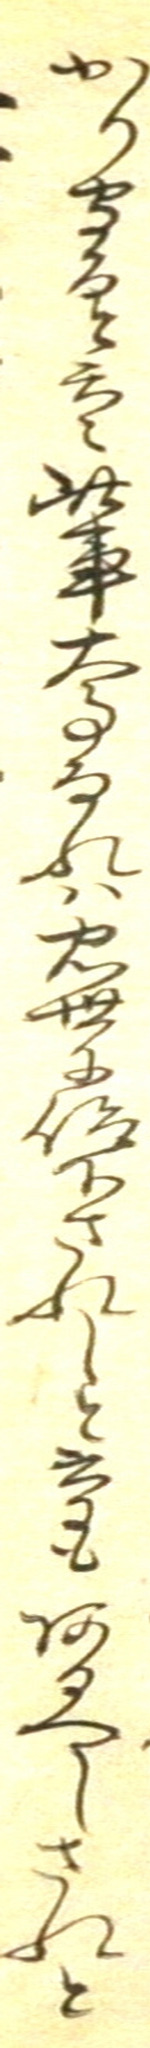かり守ると云々此事大事なれハ忠世に仰下されしと云にもあるへしされと
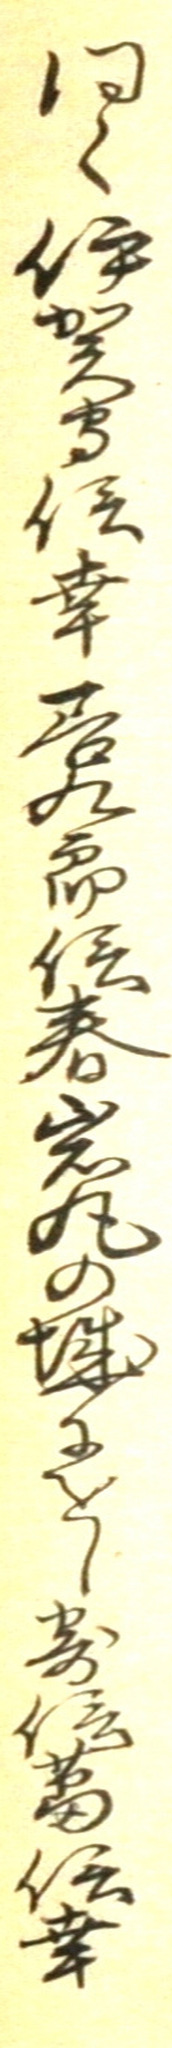同く伊賀守信幸善九郎信春岩丸の城にをし寄信蕃信幸
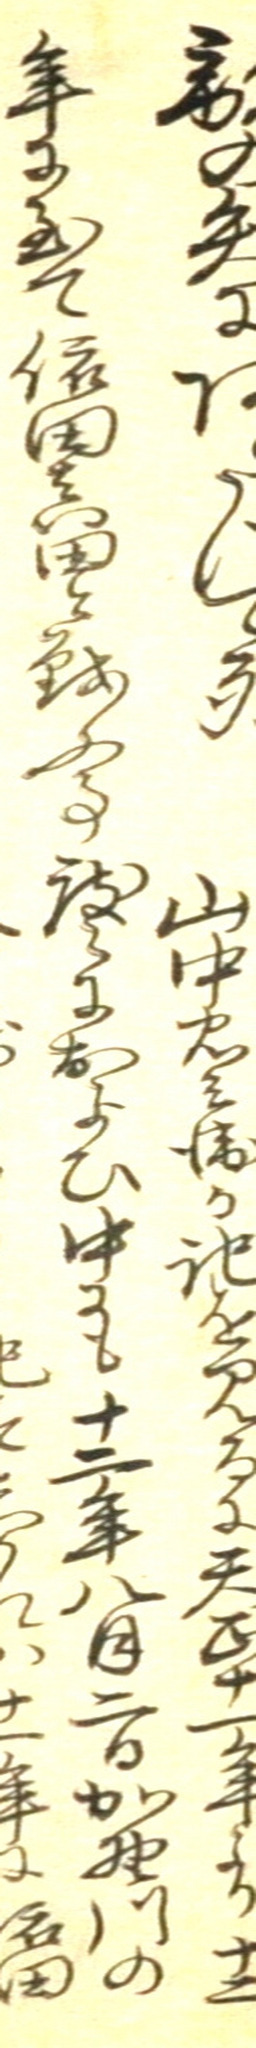年に至て依田真田と戦ふ事度々におよひ中にも十二年八月二日加野川の
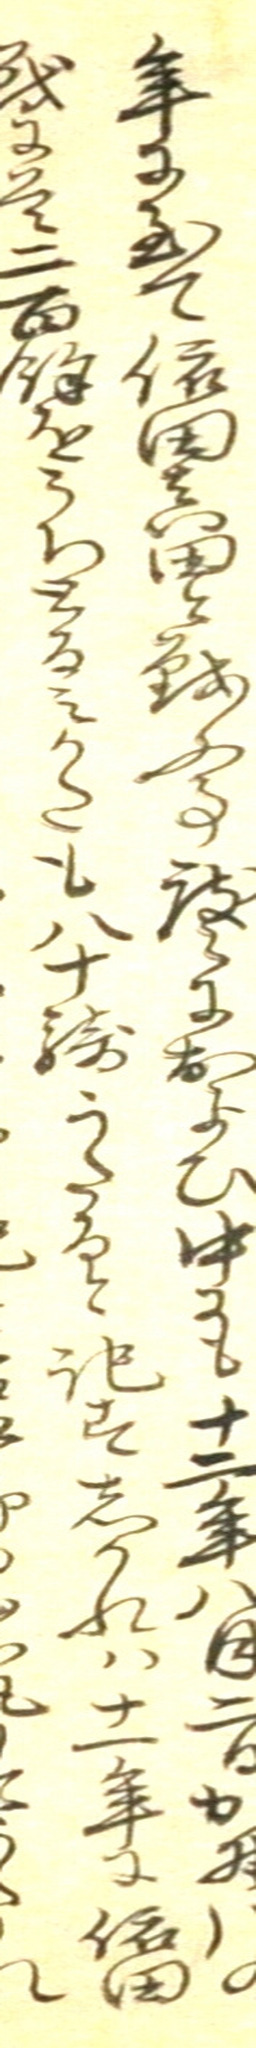戦に首二百余をうちとるみかたも八十騎うたると記すしかれは十一年に依田
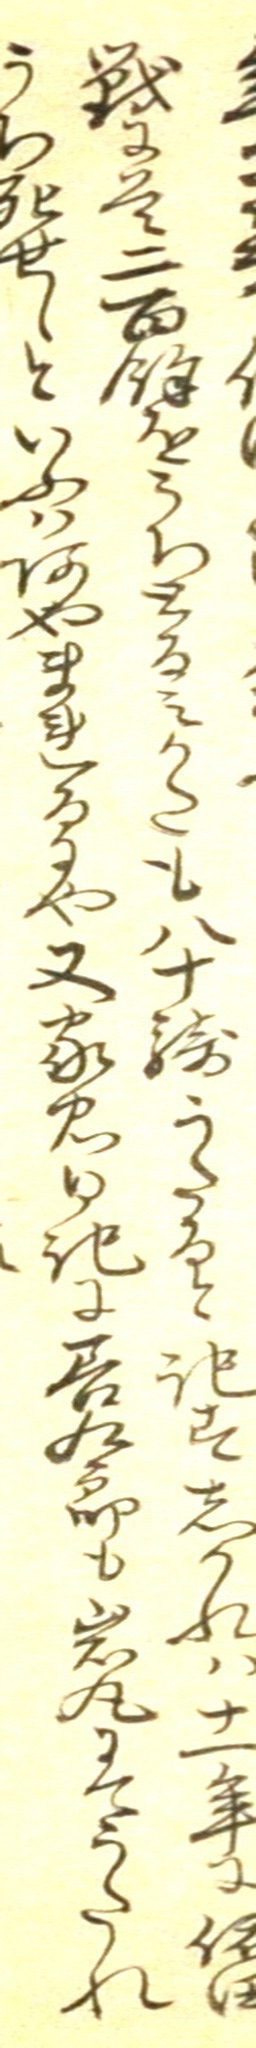うち死せしといふはあやまれるにや又家忠日記に善九郎も岩丸にてうたれ
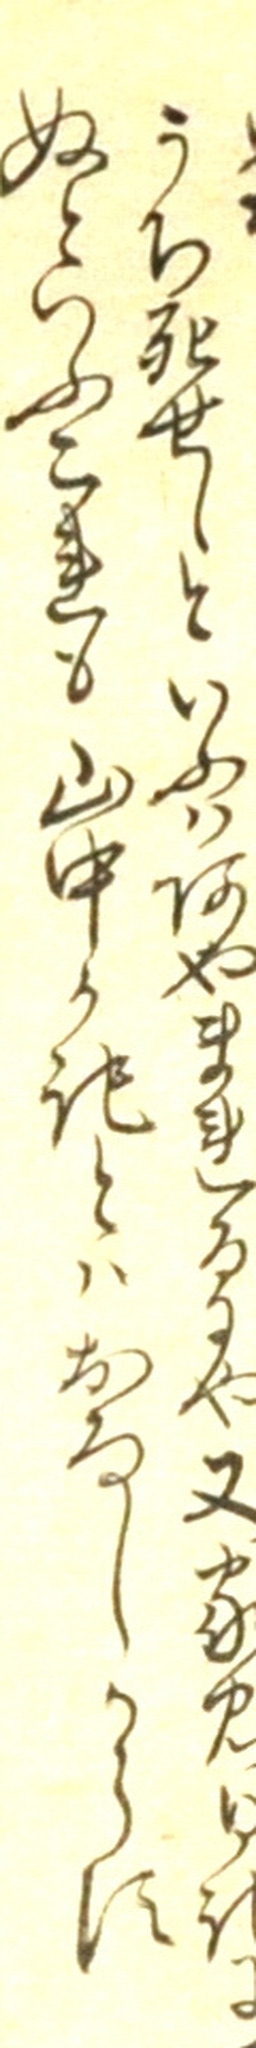ぬといふこれも山中か記とはおなしからす
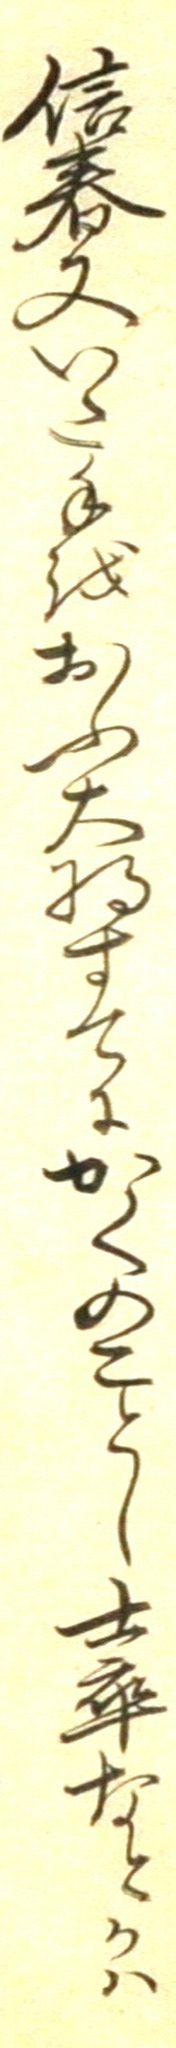信春又いた手をおふ大将すてにかくのことし士卒なとかは
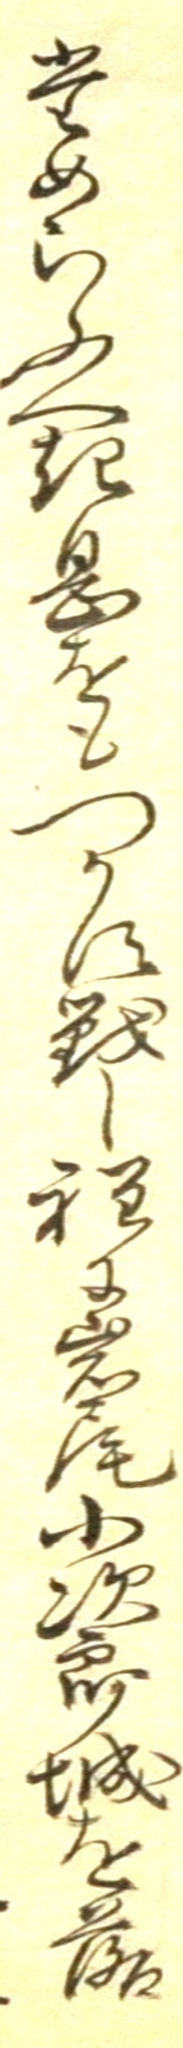ためらふへき息をもつかす戦し程に岩尾小次郎城を落
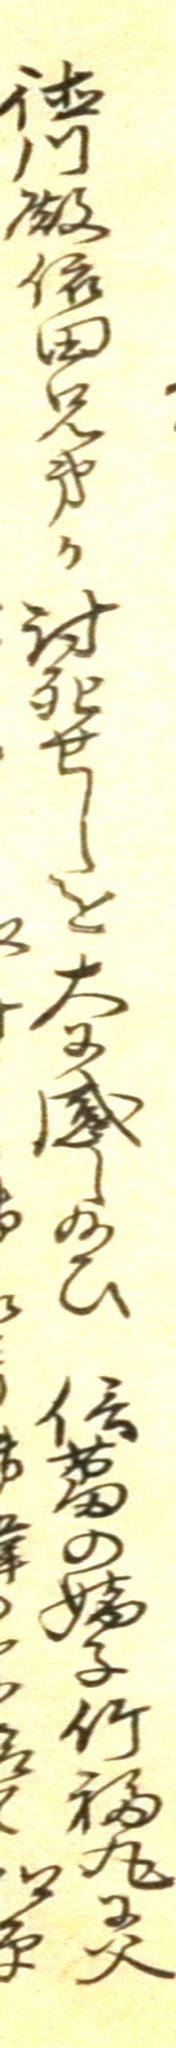徳川殿依田兄弟か討死せしを大に感し給ひ信蕃の嫡子竹福丸に父
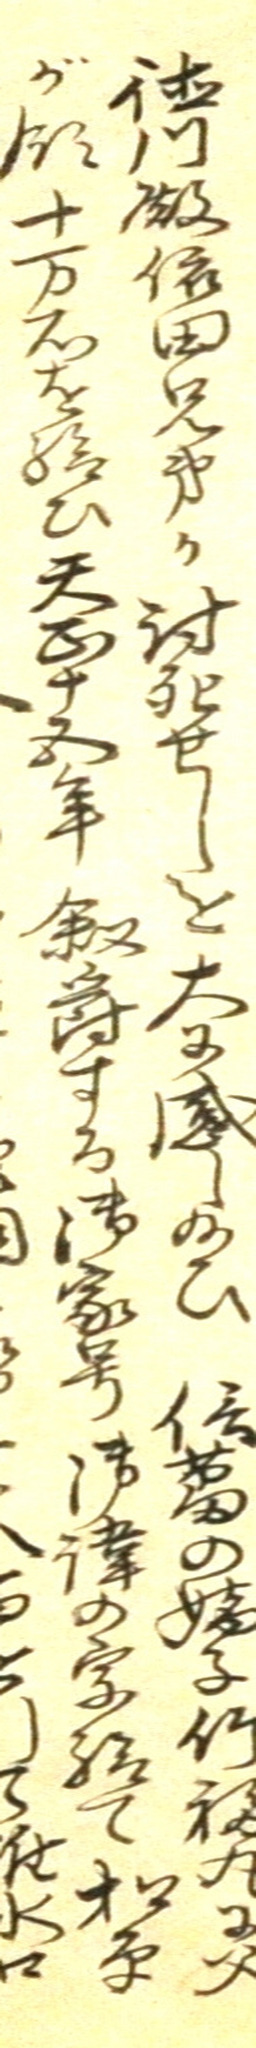が領十万石を給ひ天正十五年叙爵する御家号御諱の字給て松平
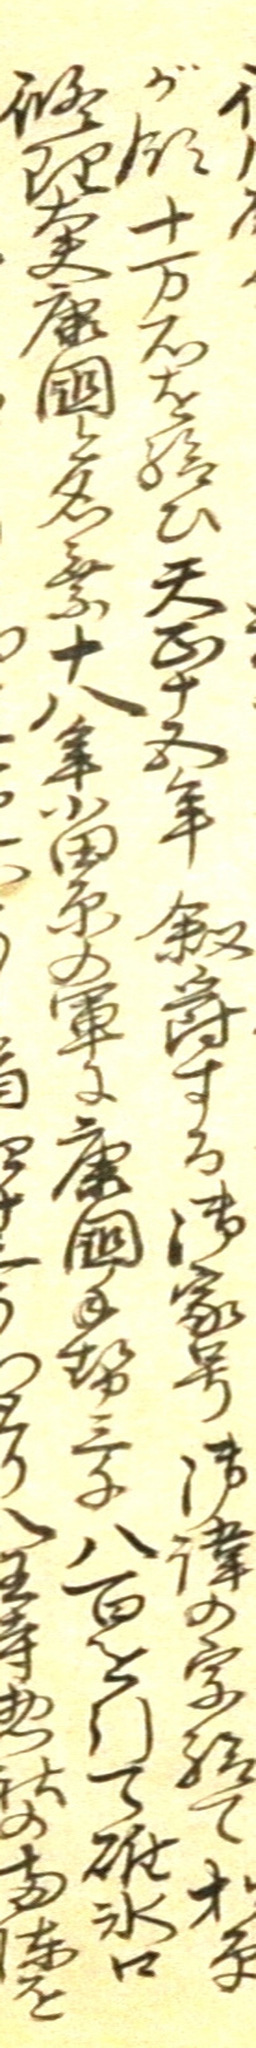修理大夫康国と名乗十八年小田原の軍に康国手勢三千八百を引て碓氷口
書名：藩翰譜（四・中）
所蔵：伊那市立高遠町図書館・合同会社AMANE
